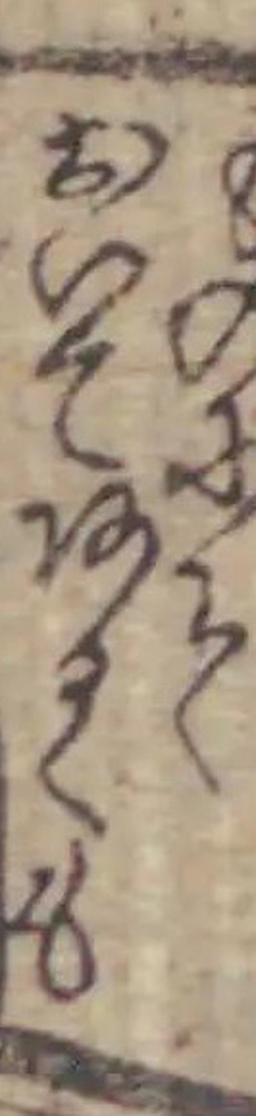おいてあるくも
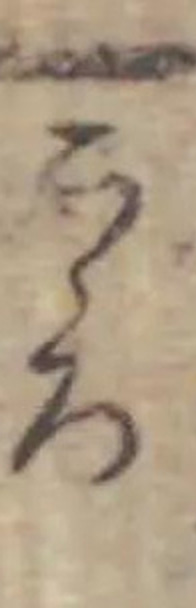こゝろ
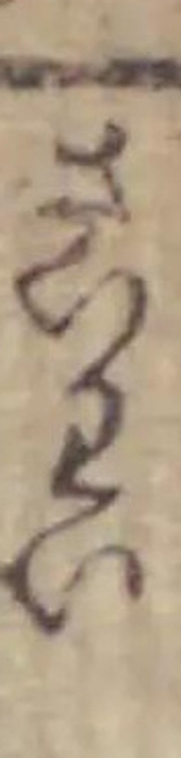さいわい
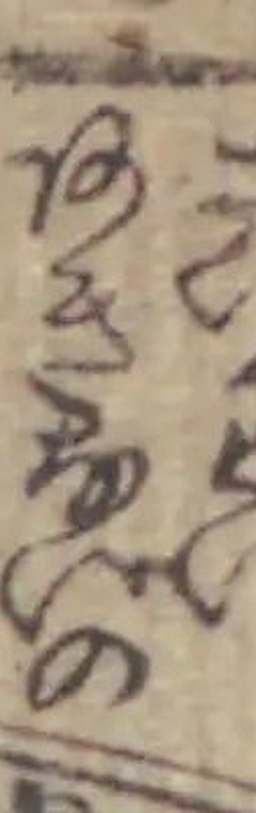あきないの
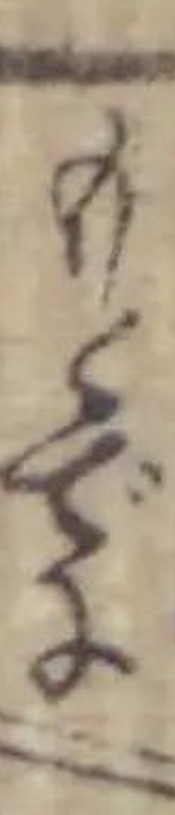もとでに
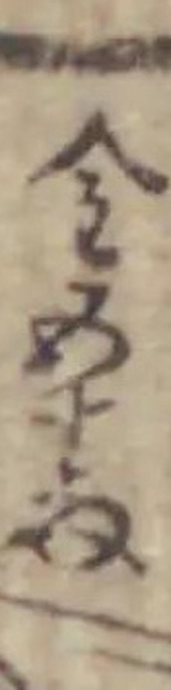金五十両
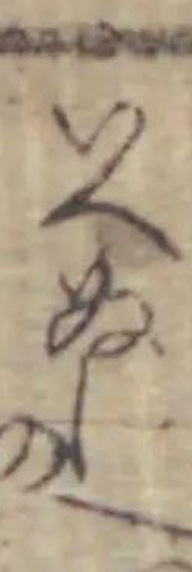いへぬしの
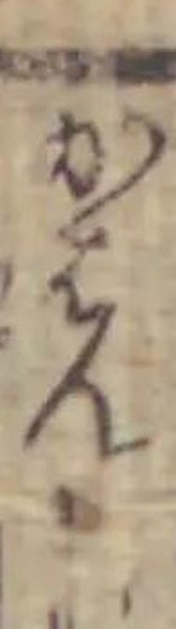かはん
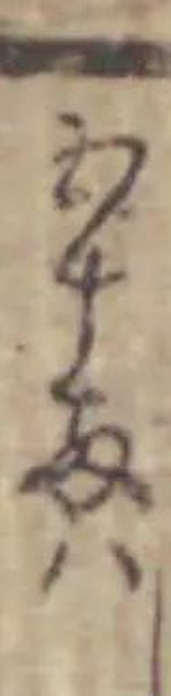五十両は
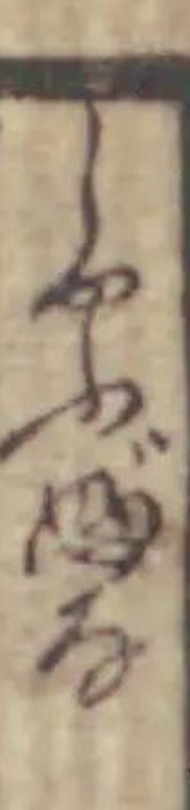しやふぶな
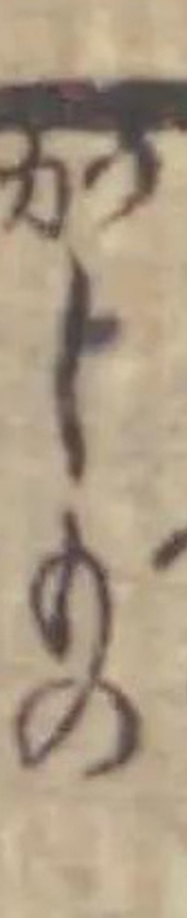かしもの
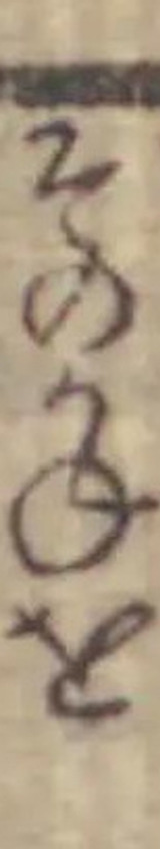そのかねを
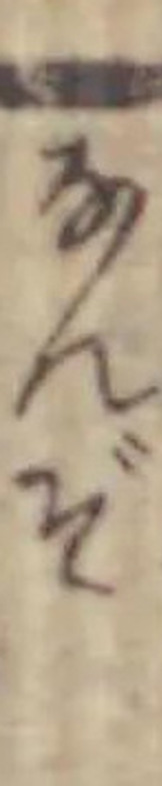なんぞ
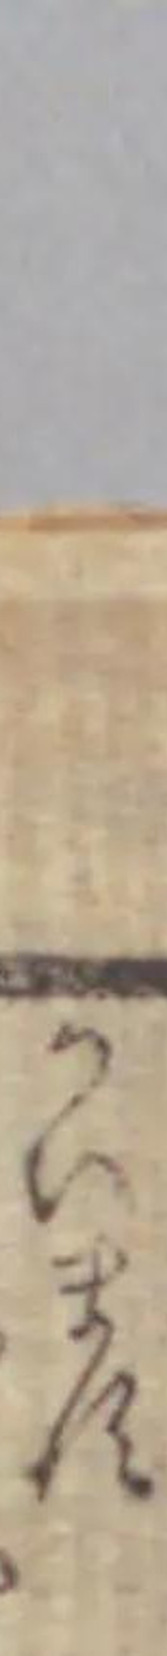かいます
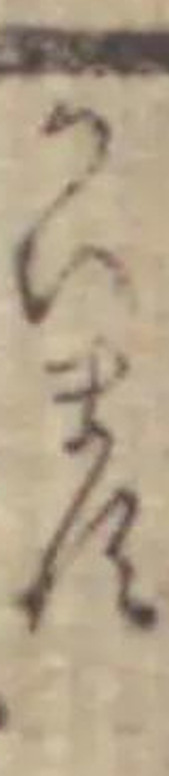かいます
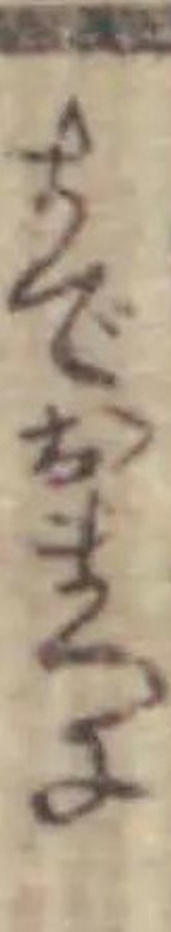までおまへに
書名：間違月夜鍋 2巻
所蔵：国立国会図書館 National Diet Library, JAPAN
